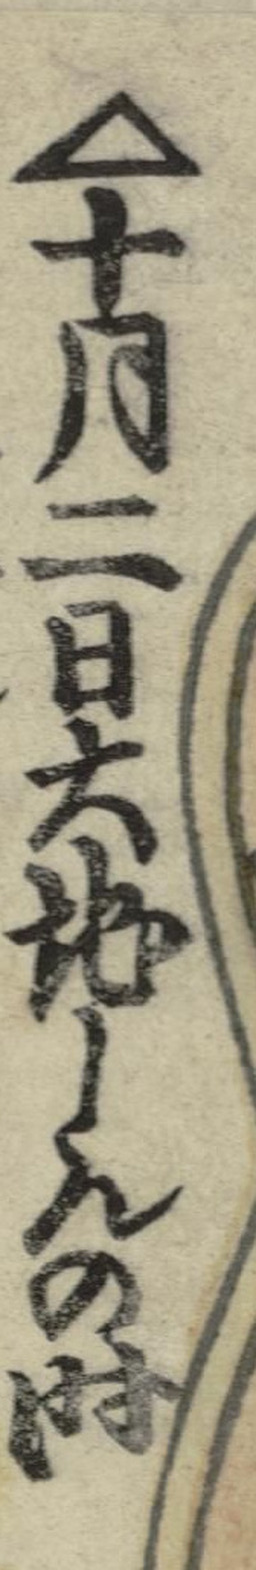△十月二日大地しんの時
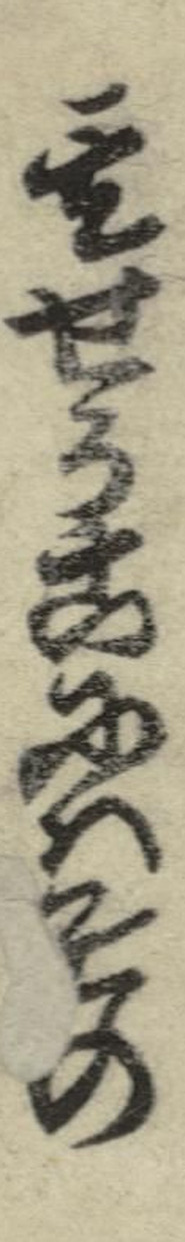其せうこにはその
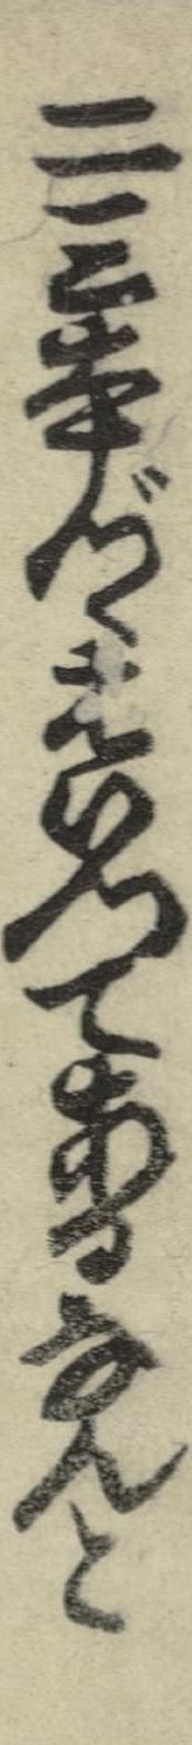二三本づゝはいつてあるなんと
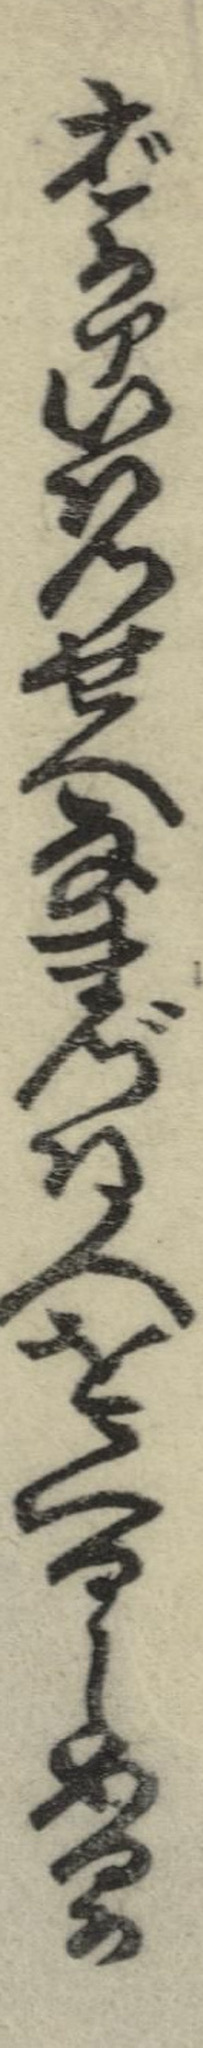ばかアいはつせへなまづは人をくるしめるか
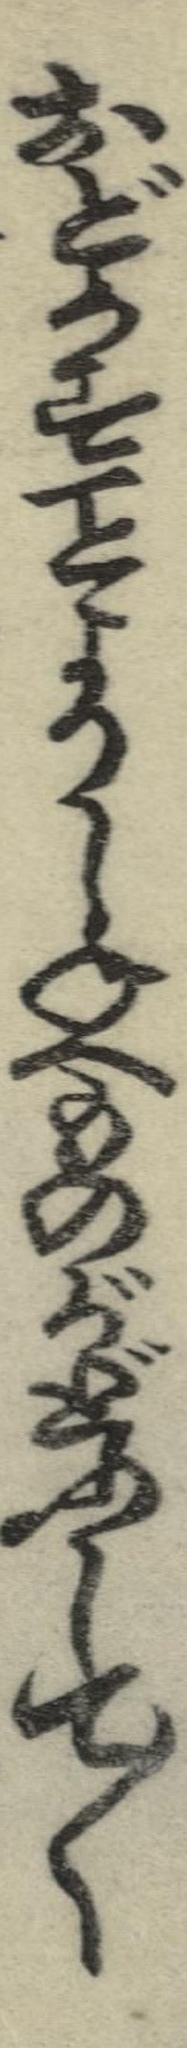おどかすことよりしねへものがどふして〳〵
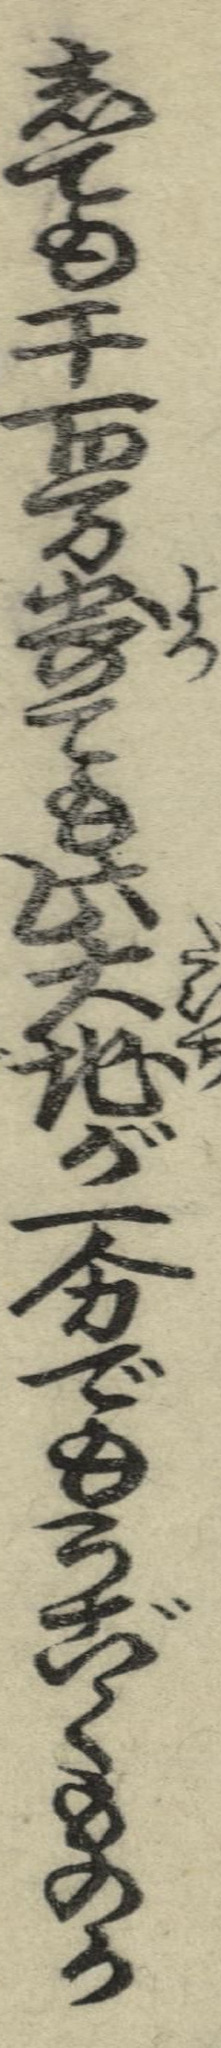しても千百万寄ても此大地が一分でもうごくものか
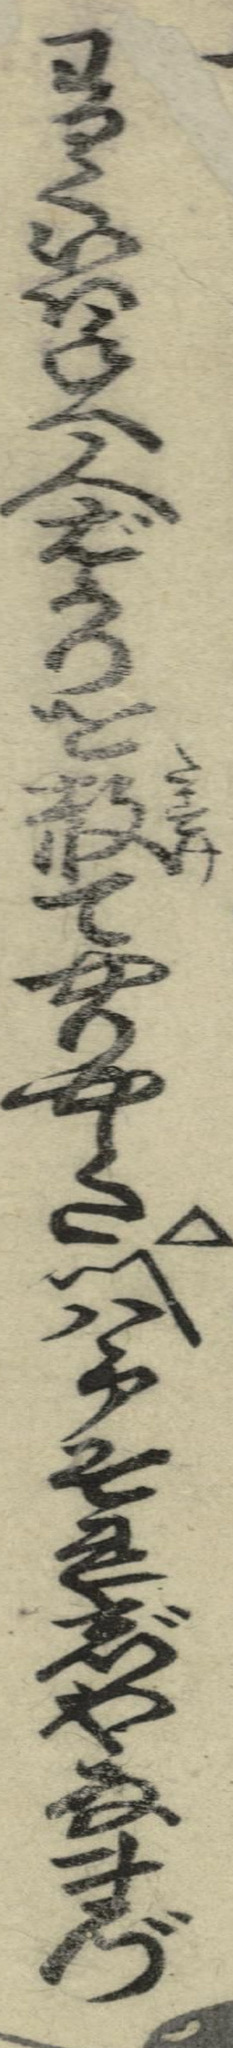わるくいはねへ人ばかりを赦たすけてやりやした△〽ハヽアそれじやなまづ
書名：世直し鯰の情
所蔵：東京大学地震研究所図書室 Earthquake Research Institute Library, The University of Tokyo, JAPAN
